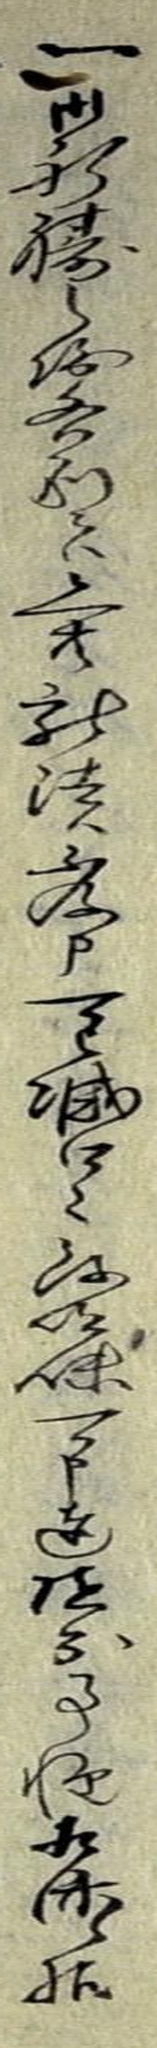一御祈祷之儀各別には候へ共新法は不及申可被減口々致吟味可申達随分事軽相済候様
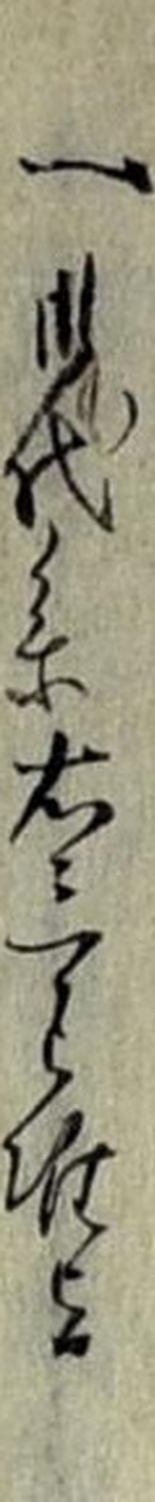一御代参右に可被准旨
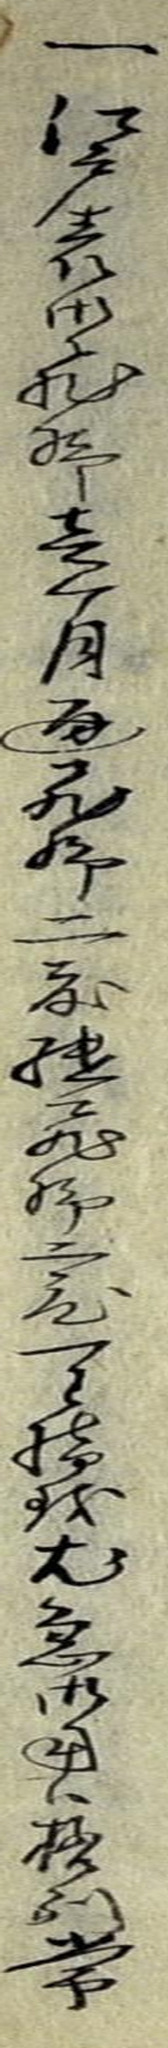一江戸表御飛脚壱ヶ月通飛脚二度継飛脚二度可被指越尤急御用は格別常
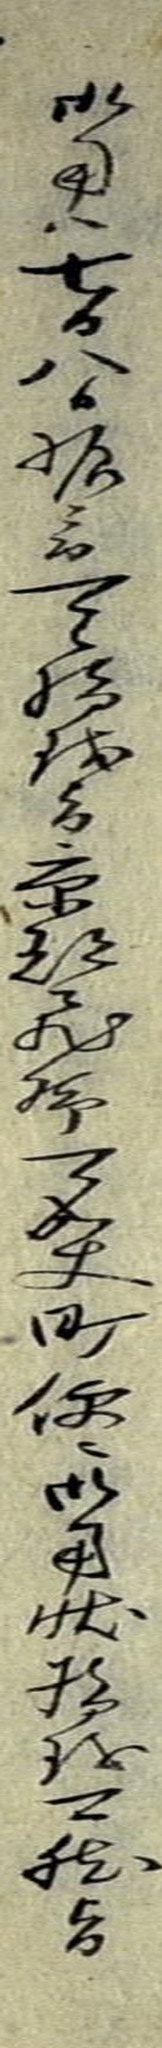御用は七日八日振に而可被指越旨京都飛脚可成丈町便に御用状指越可然旨
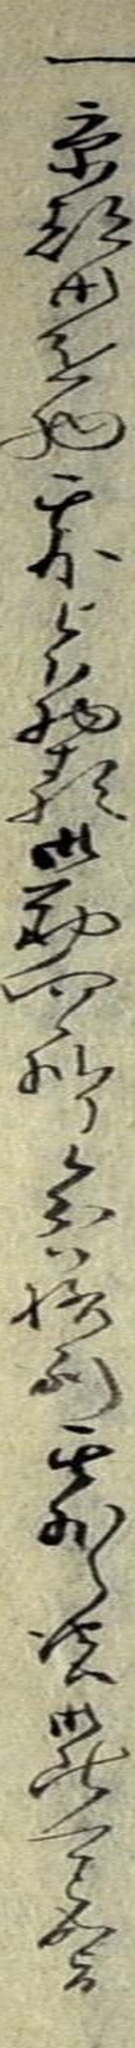一京都御進物其外被下物類御勤向へ掛り候分は格別其外之儀は御断可被成旨
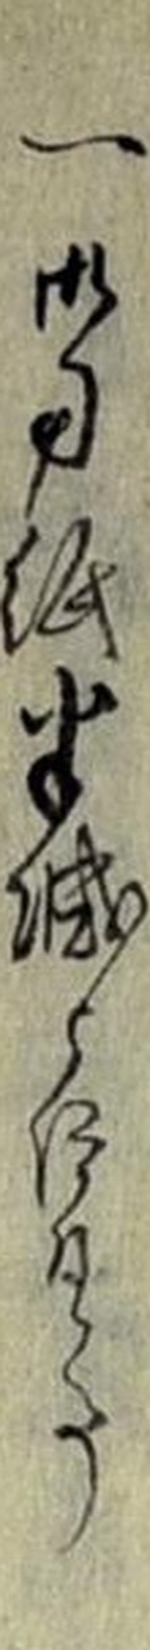一御用紙半減被仰付候事
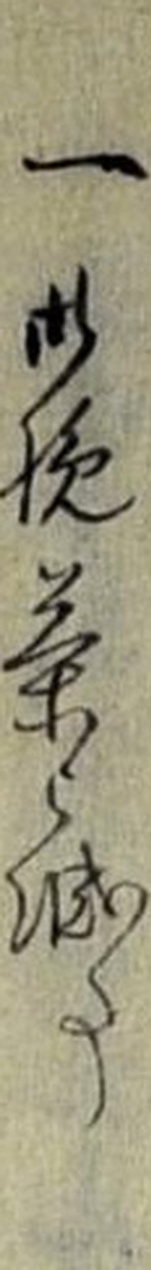一御挽茶被減事
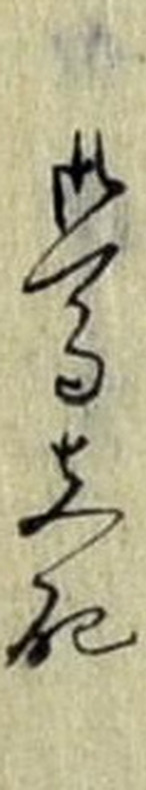御馬支配
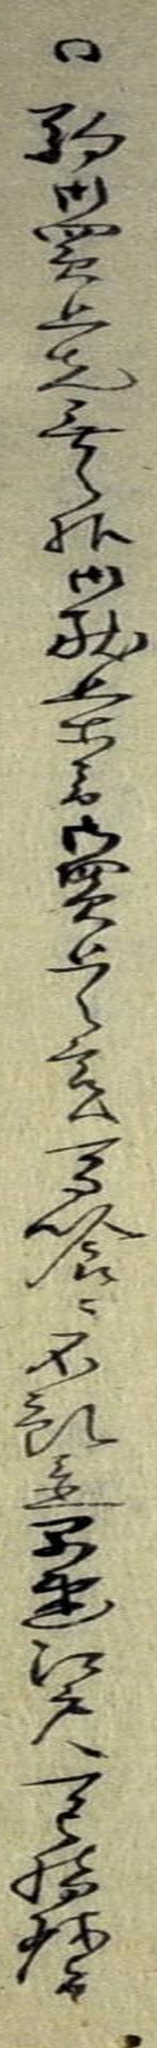〇駒御買上先無之様御献上等に而御買上之節は馬喰に不預置早速江戸へ可被指越旨
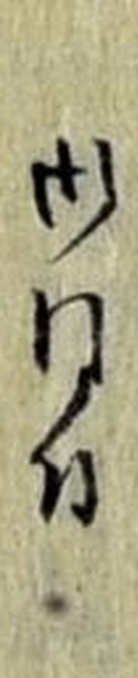御目付
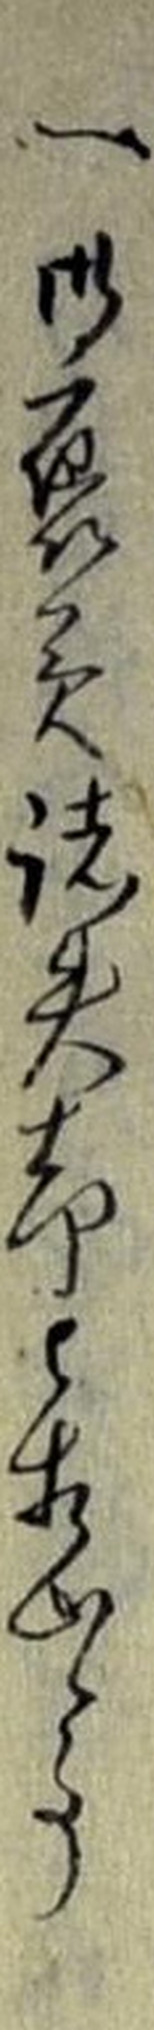一御褒美諸失却被相止候事
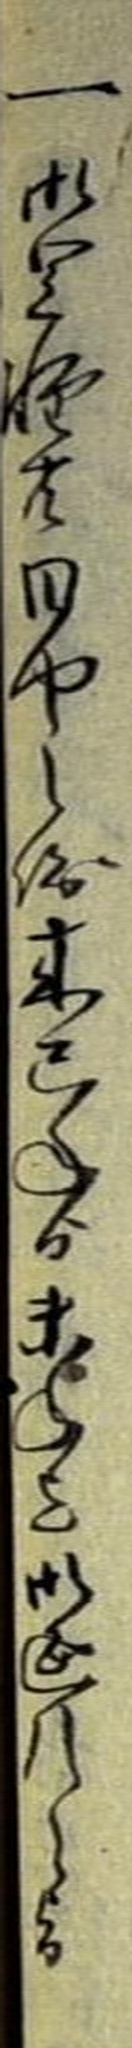一御足軽共目中之儀来巳年ゟ未年迄御延引之旨
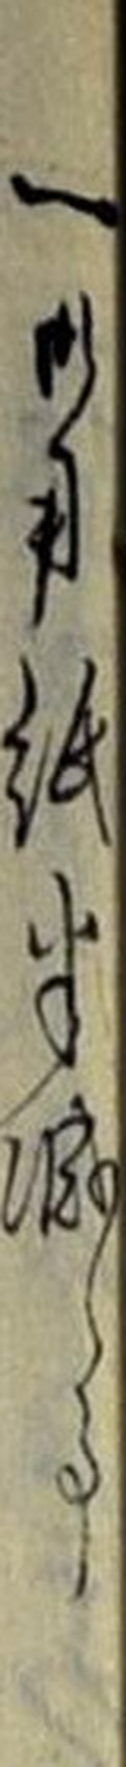一御用紙半減之事
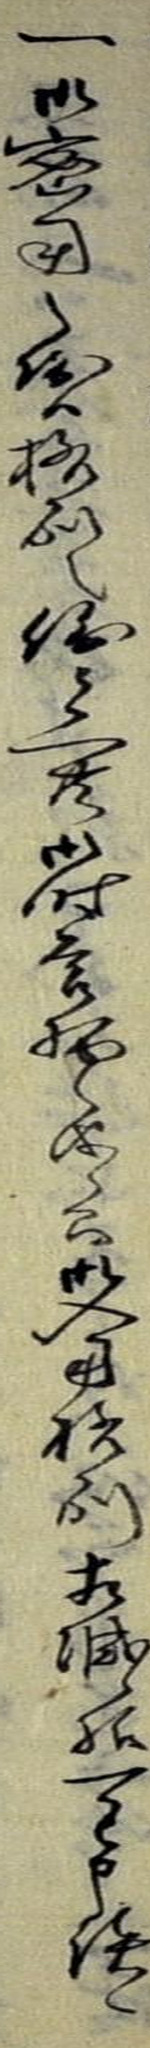一御密用之儀は格別之儀に候へ共御時節柄之儀に候間御入用格別相減候様可被申談候
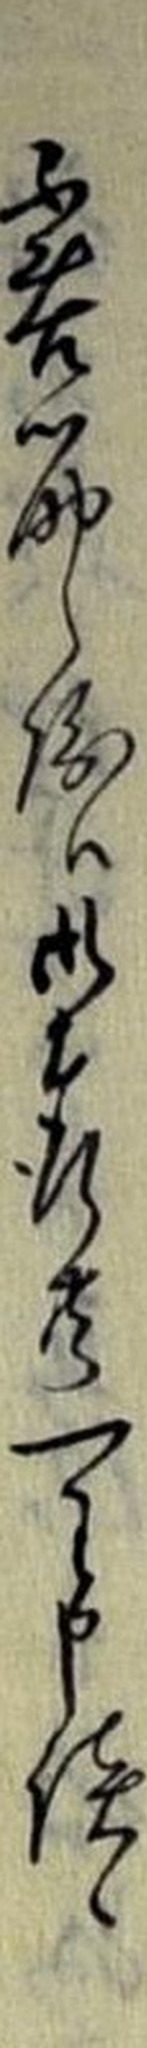不苦筋之儀は御奉行共可被申談候
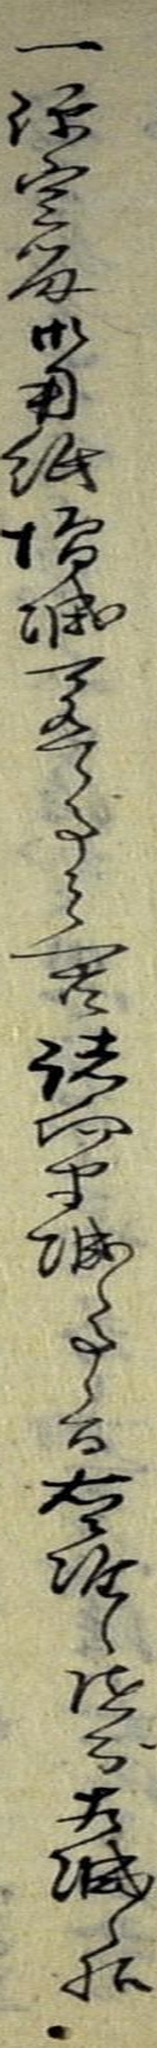一評定留御用紙増減可有之事に候へ共諸向半減之事候間右に准し随分相減候様
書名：命令之部 二
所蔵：福井県文書館 Fukui Prefectural Archives
